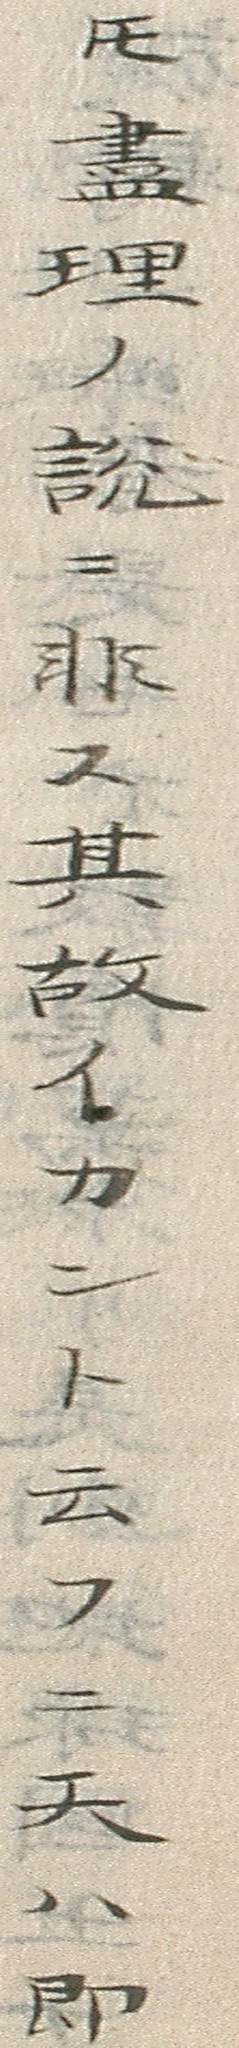トモ尽理ノ説ニ非ス其故イカント云フニ天ハ即
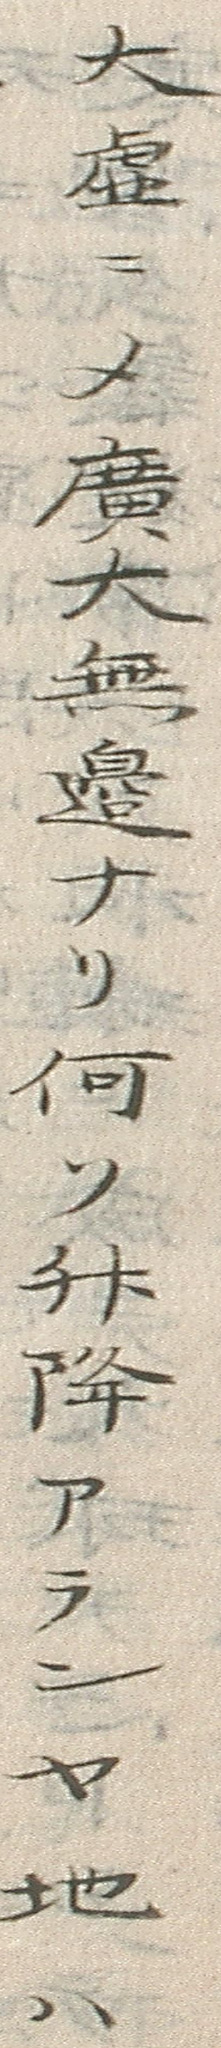大虚ニシテ広大無辺ナリ何ソ昇降アランヤ地ハ
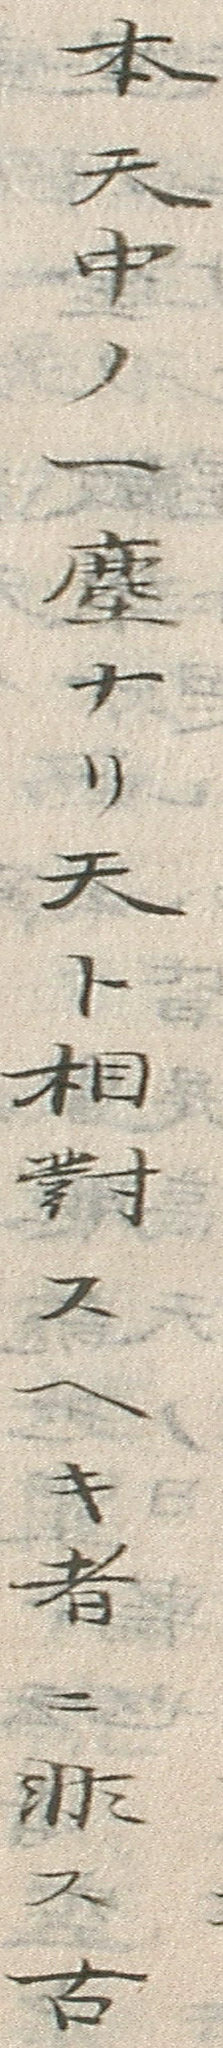本天中ノ一塵ナリ天ト相対スヘキ者ニ非ス古
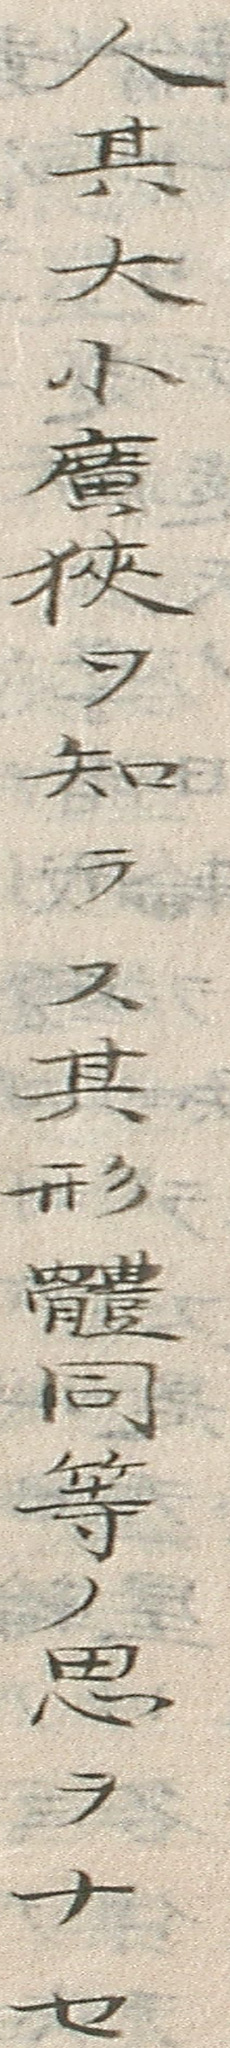人其大小広狭ヲ知ラス其形体同等ノ思ヲナセ
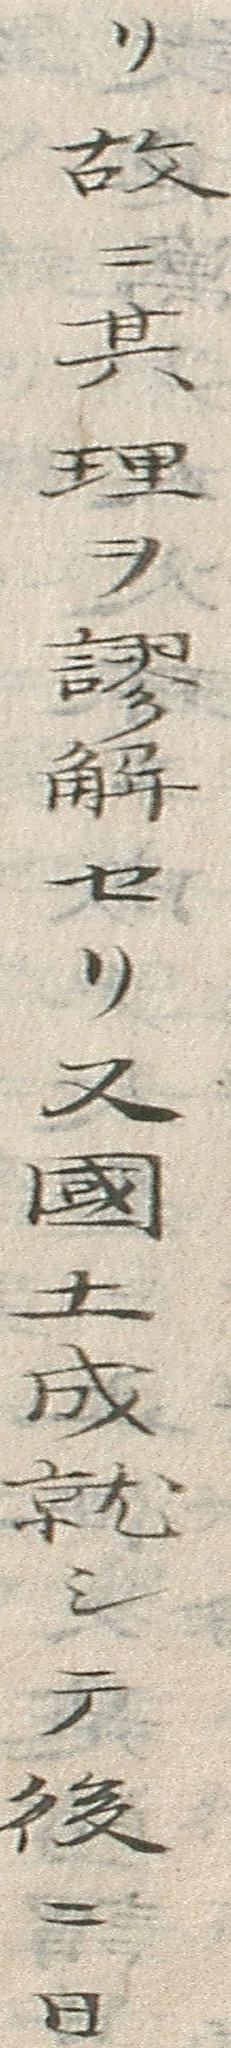リ故ニ其理ヲ謬解セリ又国土成就シテ後ニ日
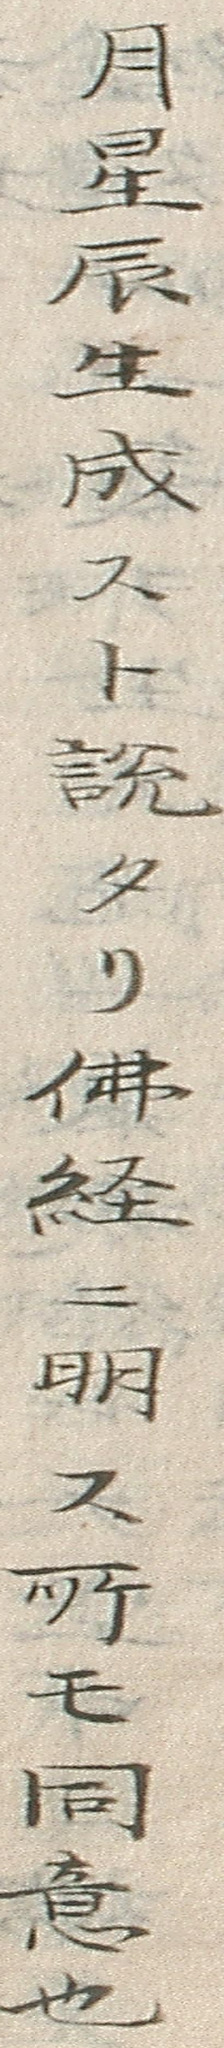月星辰生成スト説タリ仏経ニ明ス所モ同意也
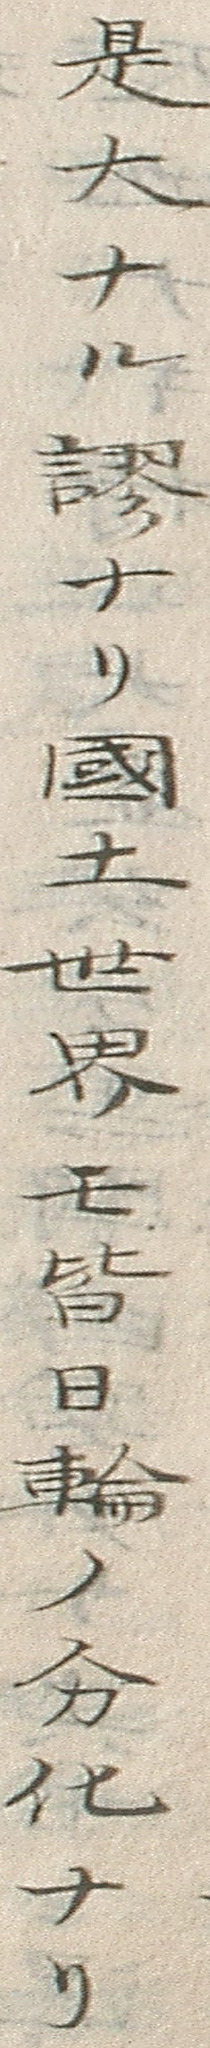是大ナル謬ナリ国土世界モ皆日輪ノ分化ナリ
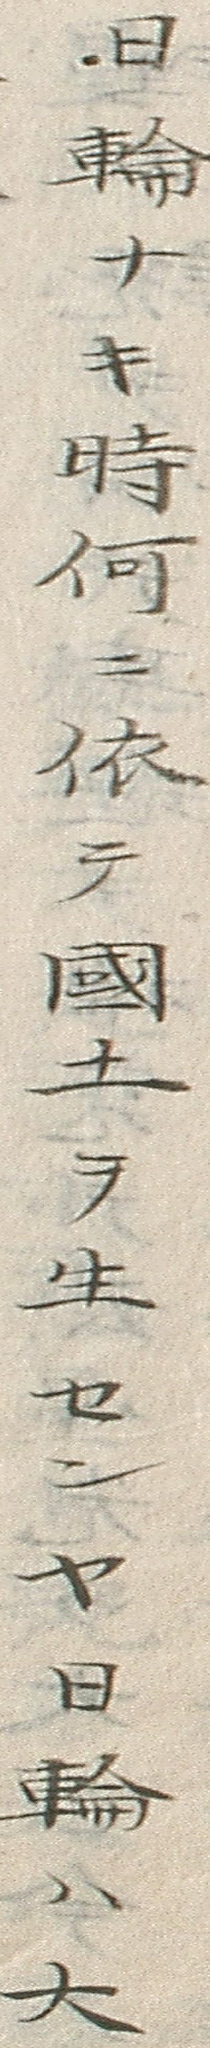日輪ナキ時何ニ依テ国土ヲ生センヤ日輪ハ大
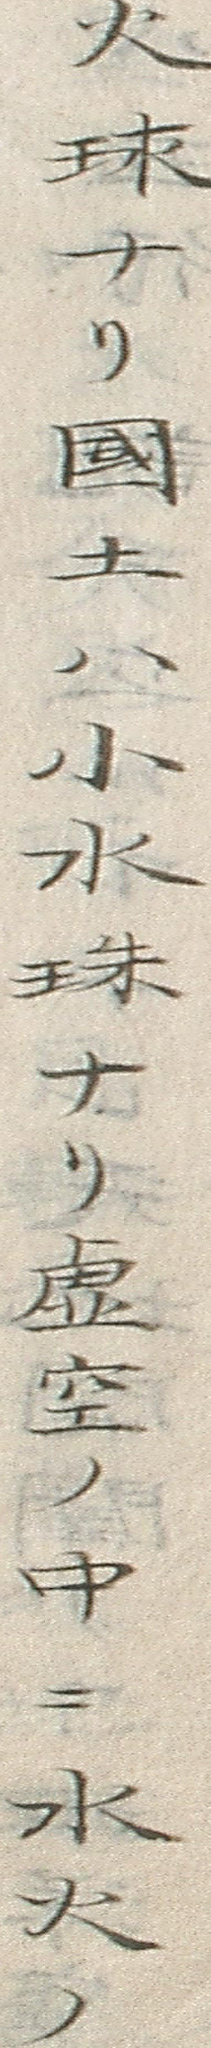火球ナリ国土ハ小水珠ナリ虚空ノ中ニ水火ノ
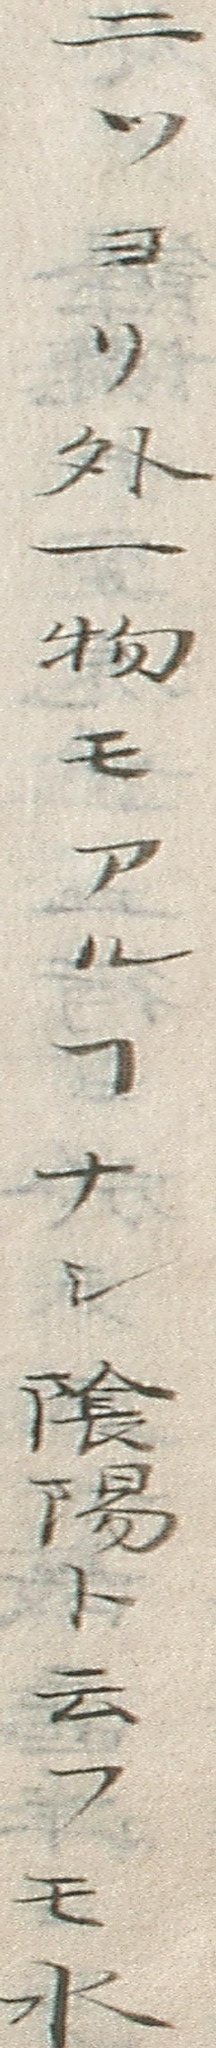二ツヨリ外一物モアルコトナシ陰陽ト云フモ水

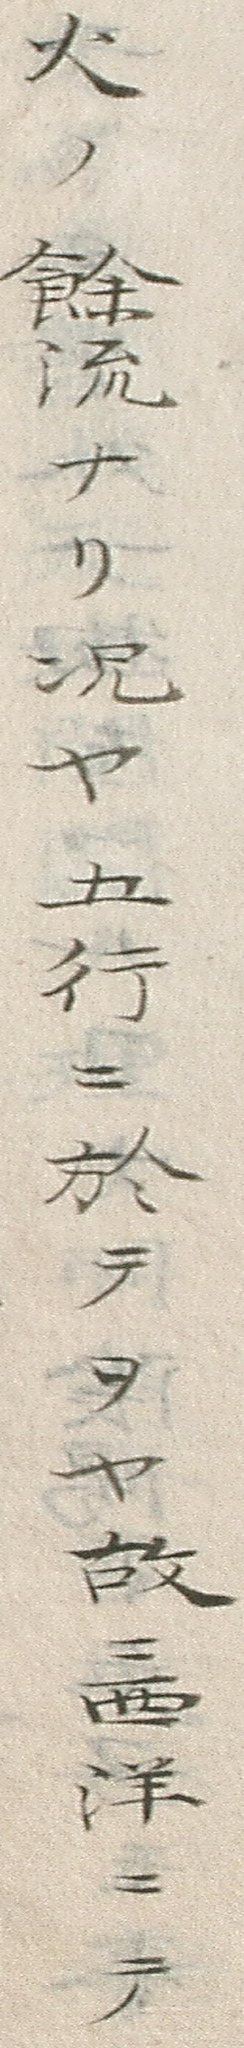火ノ余流ナリ況ヤ五行ニ於テヲヤ故ニ西洋ニテ
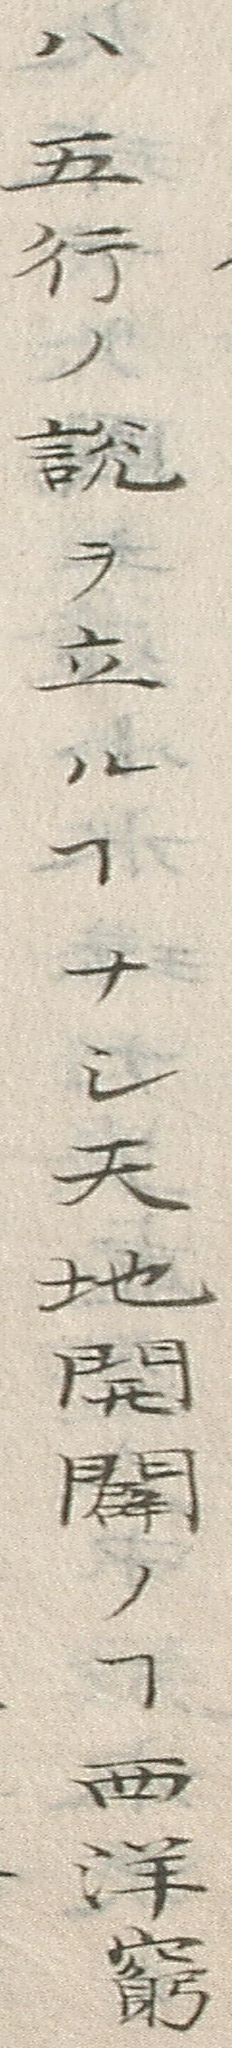ハ五行ノ説ヲ立ルコトナシ天地開闢ノコト西洋窮
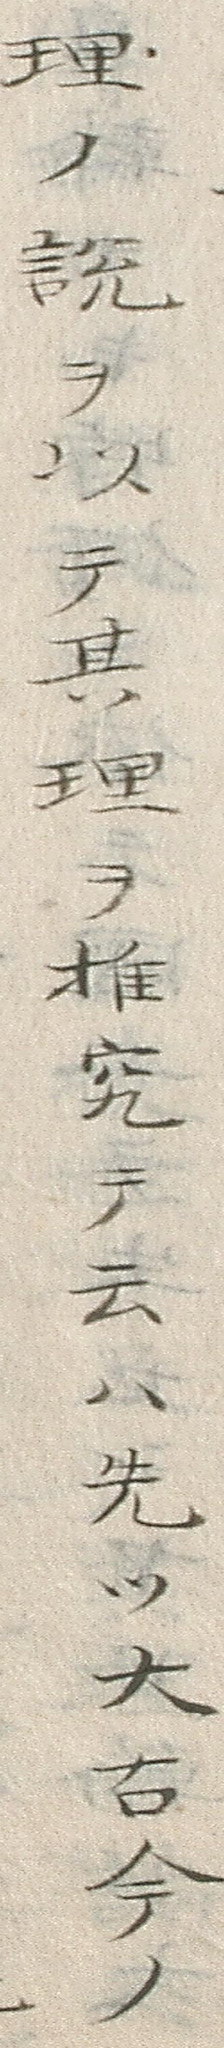理ノ説ヲ以テ其理ヲ推究テ云ハ先ツ大古今ノ
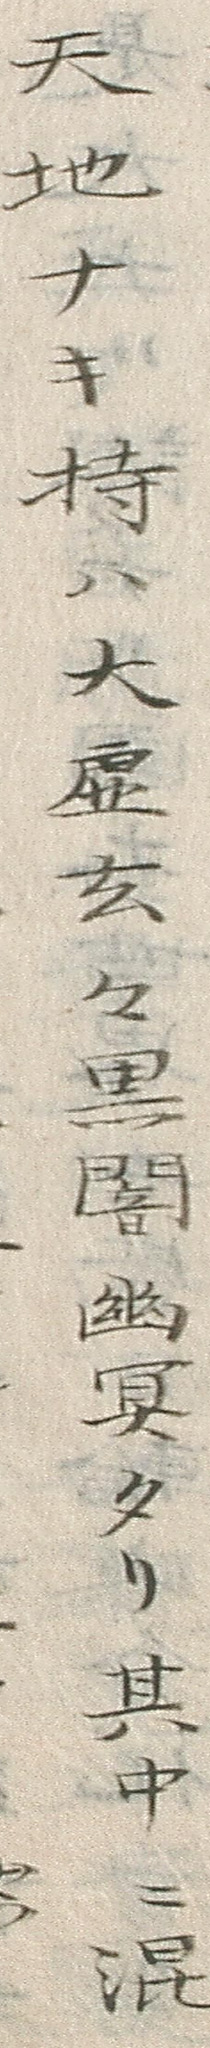天地ナキ㭙ハ大虚玄々黒闇幽冥タリ其中ニ混
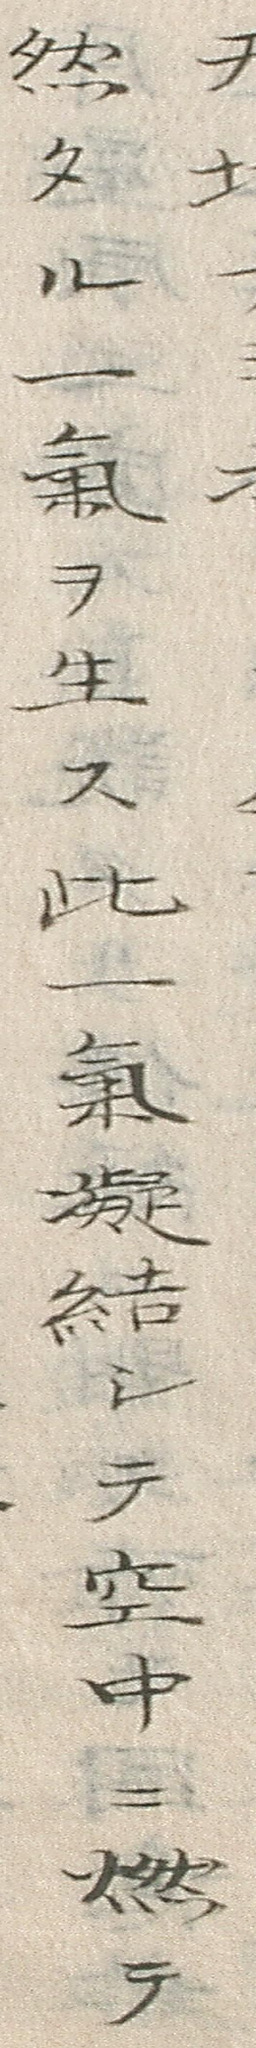然タル一気ヲ生ス此一気凝結シテ空中ニ燃テ
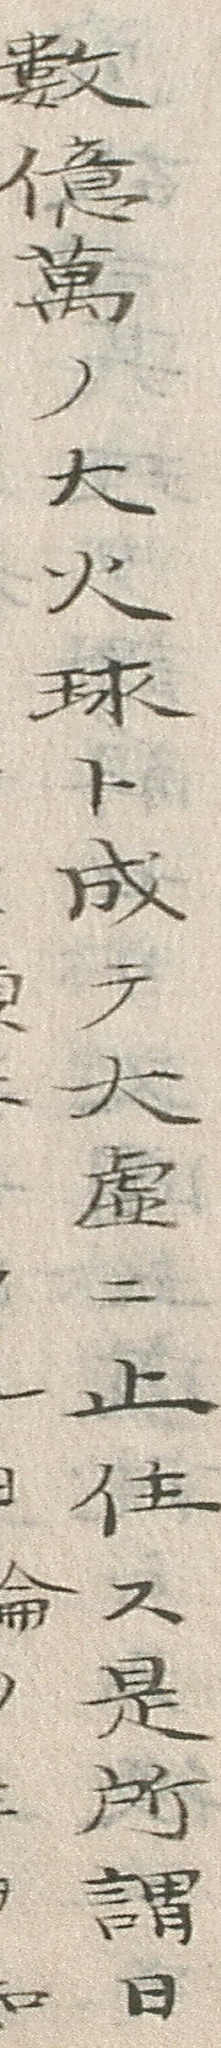数億万ノ大火球ト成テ大虚ニ止住ス是所謂日
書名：天學略名目羽翼　全
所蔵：東京大学地震研究所図書室 Earthquake Research Institute Library, The University of Tokyo, JAPAN
